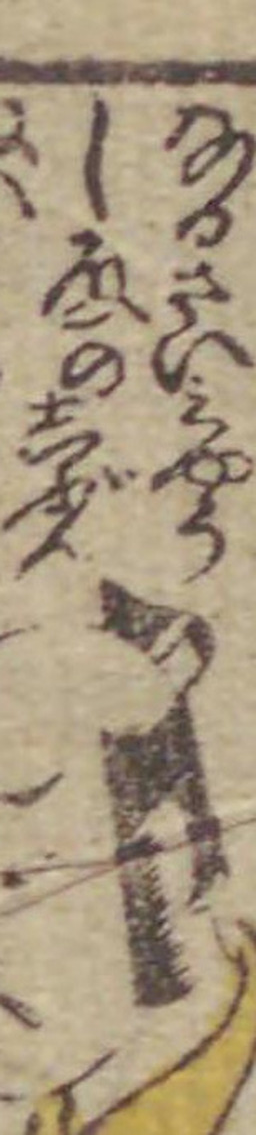し殿のしぶん
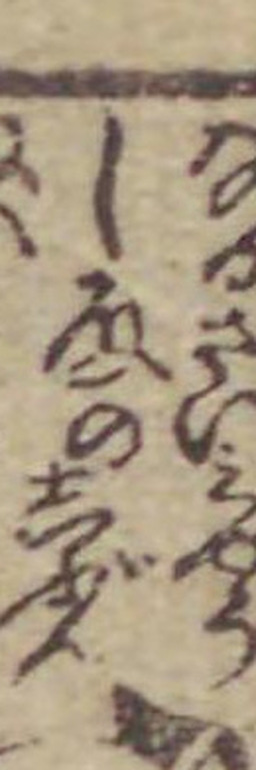し殿のしぶん
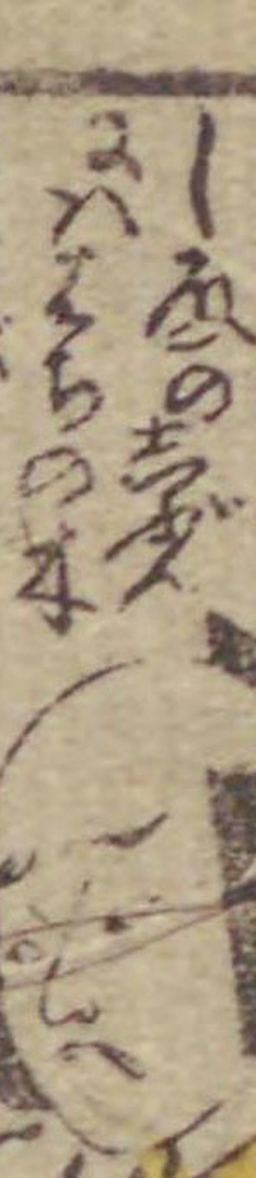にははちの木
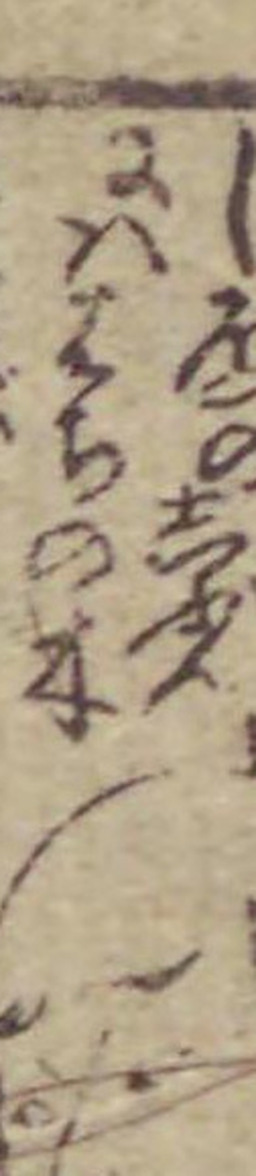にははちの木
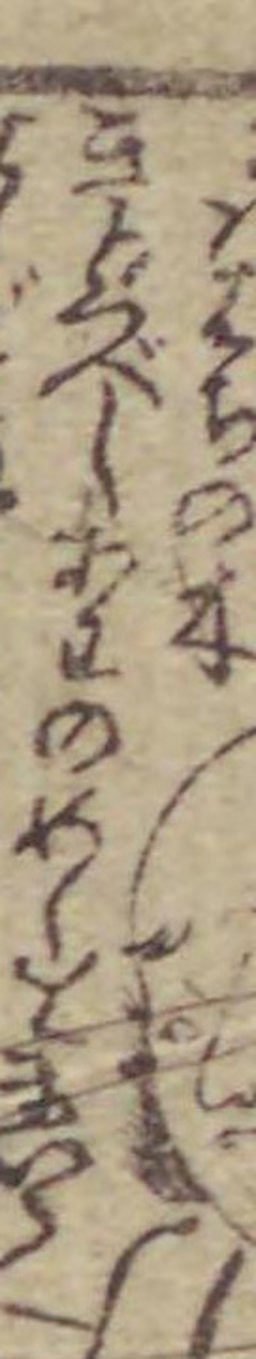きくべしあわのめしをまいら
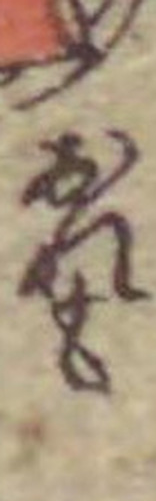おれも
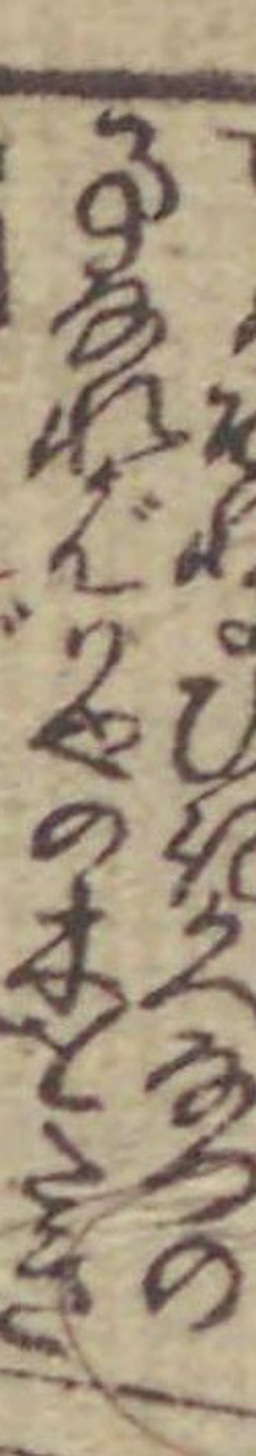事なればかやの木をたき
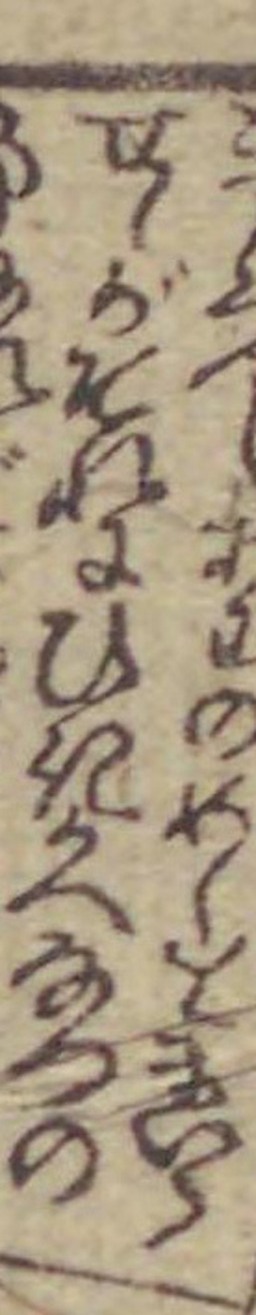せしがそれにひきかへなつの
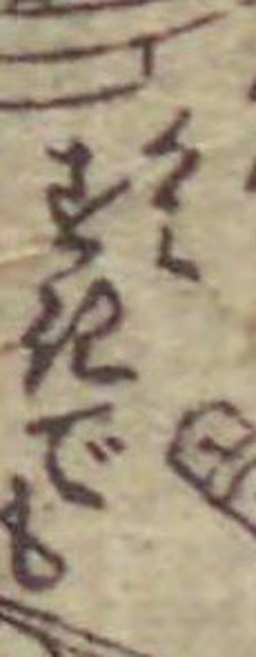すきでも
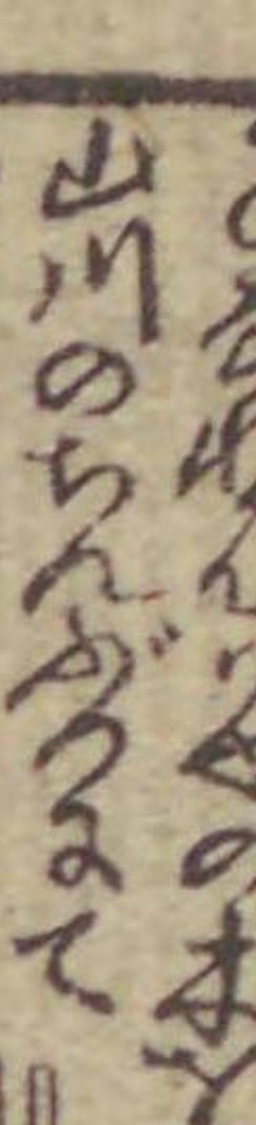山川のちんぶつにて
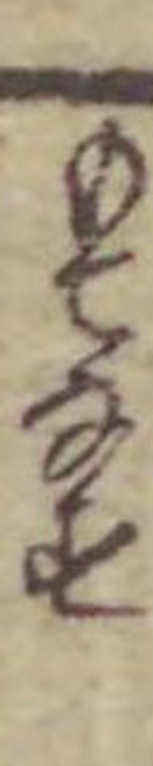もてなす
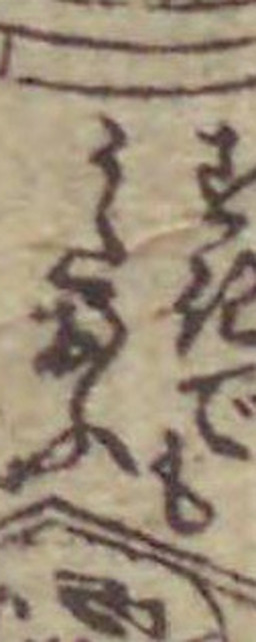うたおふ
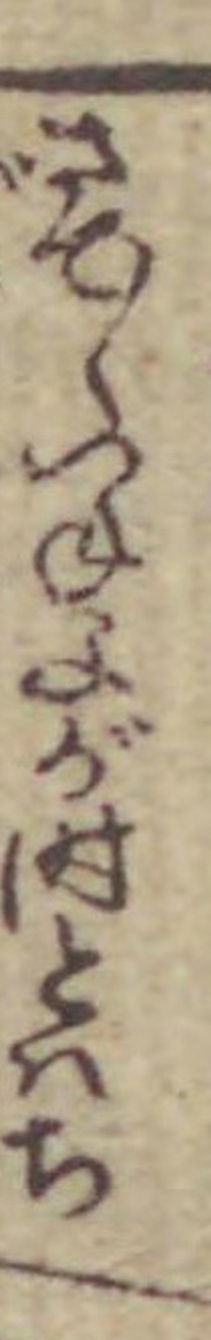さて〳〵つねよが時とはち
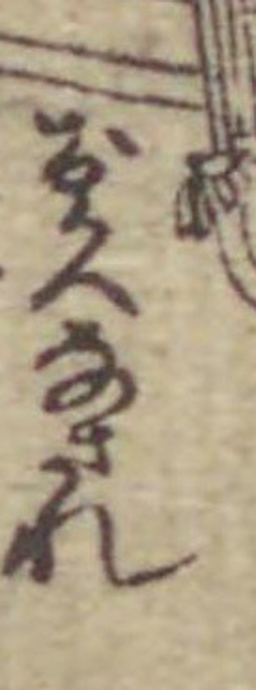おかへなされ
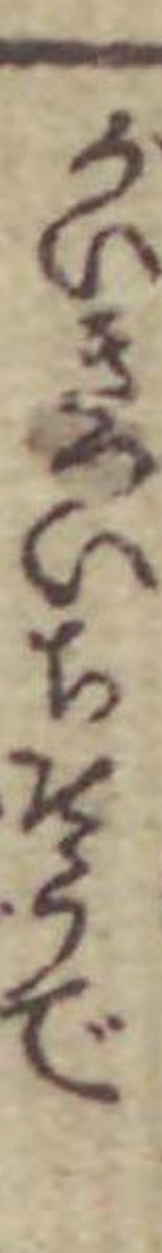がいきついちそうで
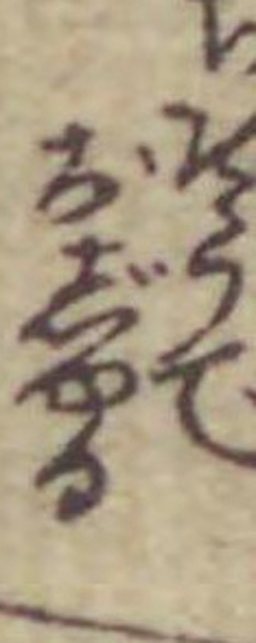おじやる
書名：娜二代鉢木 5巻
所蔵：国立国会図書館 National Diet Library, JAPAN
